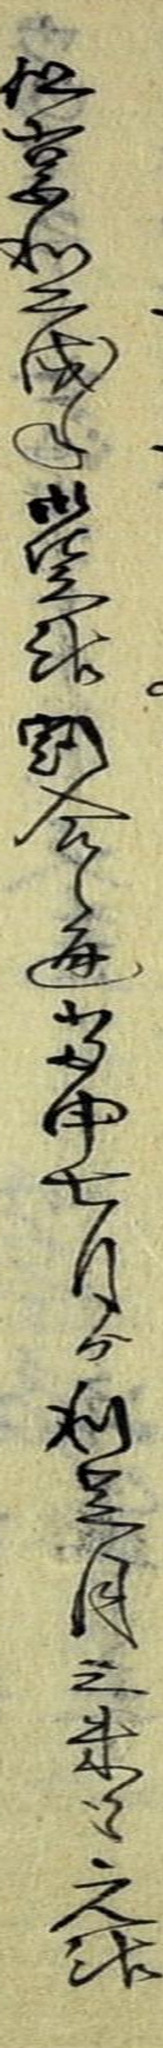但享和二戌年御貸銀割合之通当申七月ゟ利息月三朱つヽ元銀
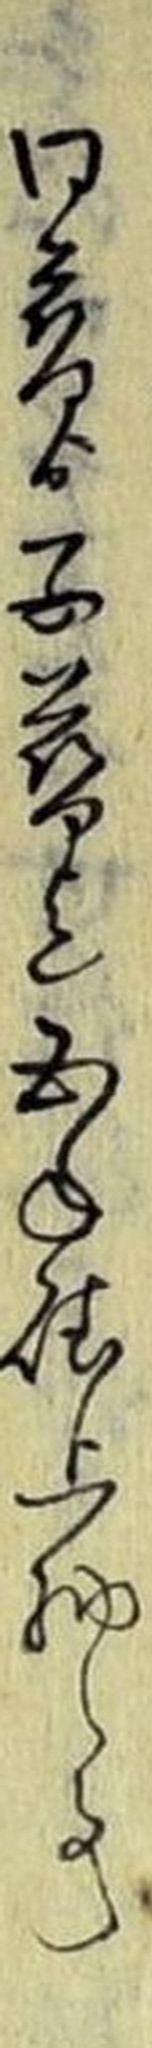同暮ゟ子暮迄五年賦上納之事
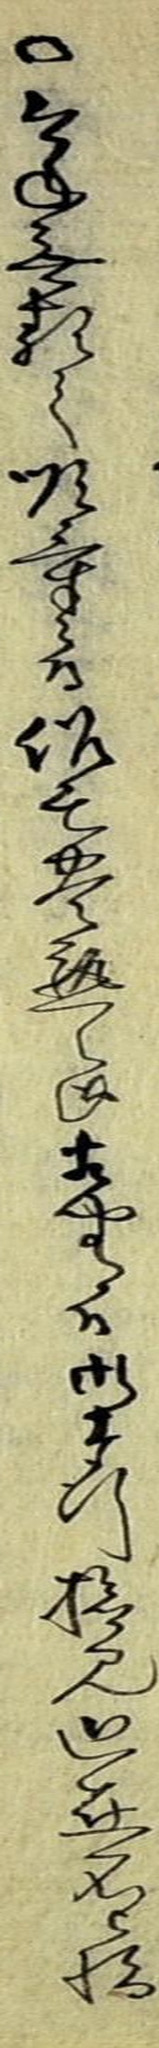○今年無類之順気に付作毛豊熟之趣相聞候に付御奉行検見廻在不被指
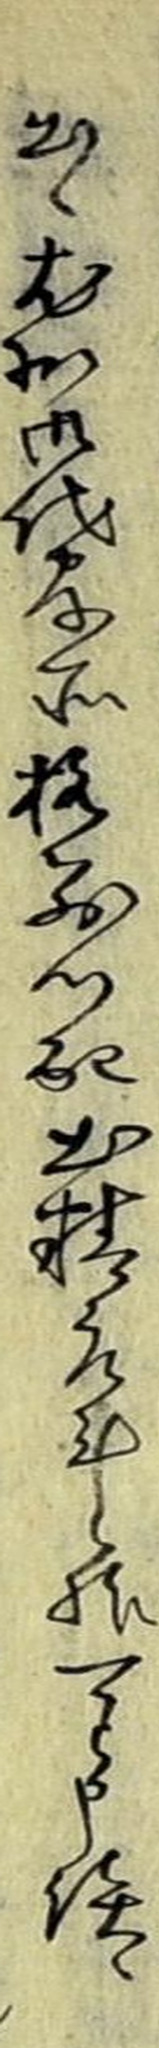出候尤於御代官所格別心配出精取斗候様可被申談候
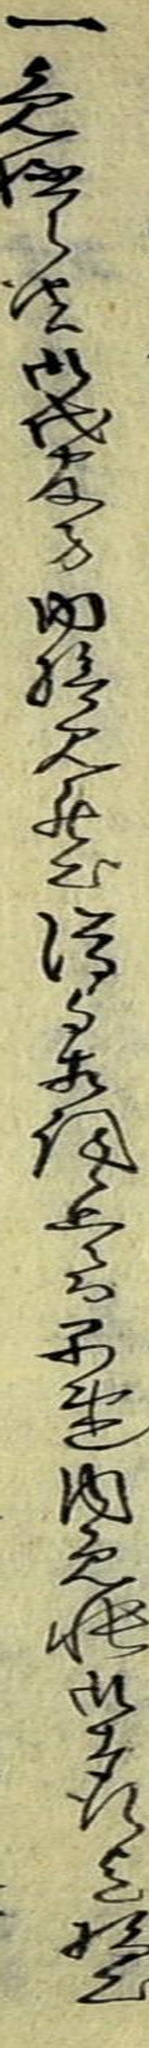一免極之儀は御代官方内検見罷出得と相調候上に而早速内免帳御奉行迄指出
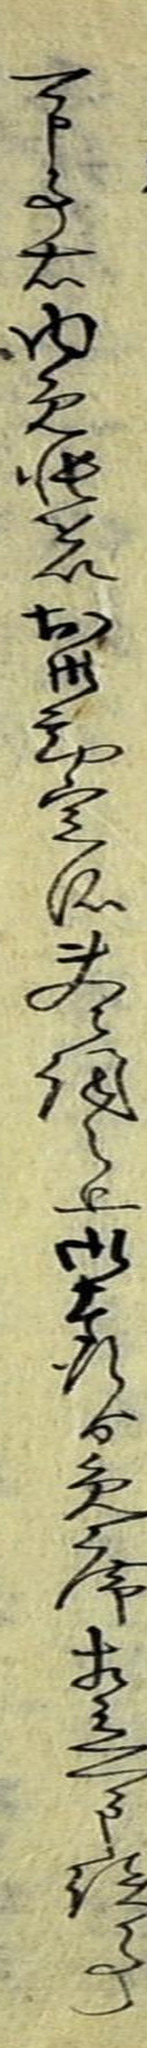可申事右内免帳を以於御勘定所夫々調之上御奉行ゟ免席相立可申談事
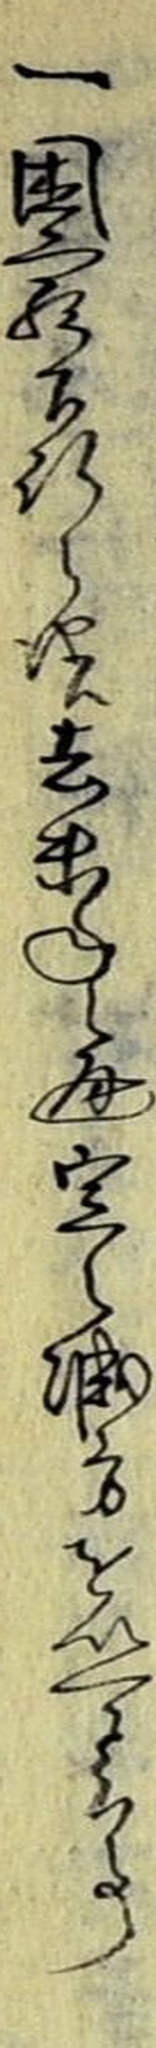一困窮下行之儀は去未年之通定之減方を以可被下事
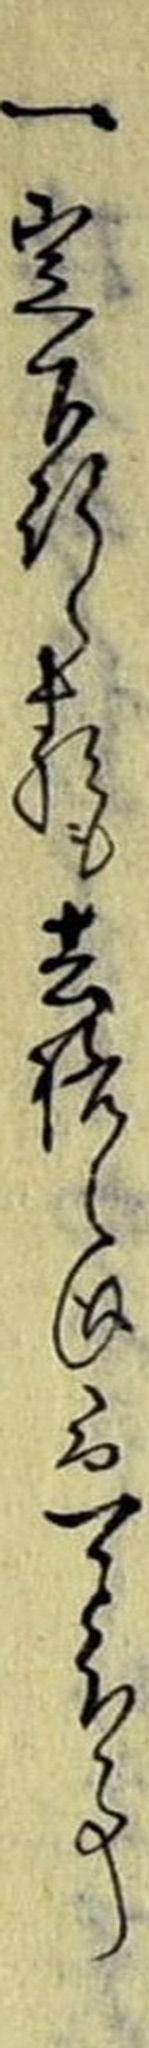一定下行の類も去秋之趣に而可被下事

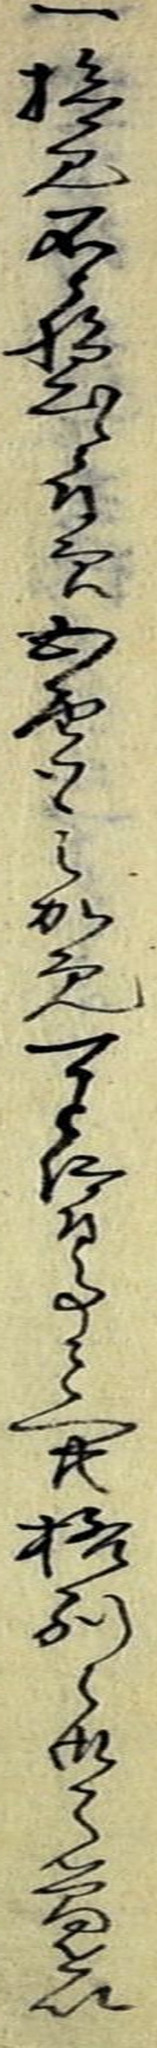一検見不指出候に付而は五厘つヽ之加免可被仰付事に候へ共格別之御了簡を以
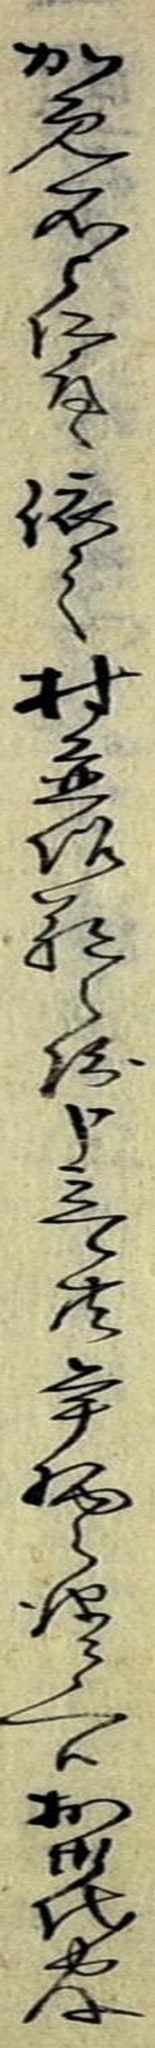加免不被仰付候依之村並作難之儀申立候共年柄之儀に候へは於御代官
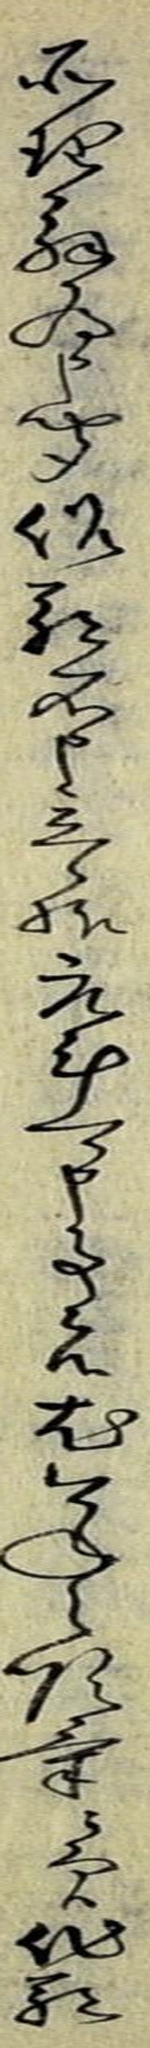所理解為申聞作難不申立候様取斗可申事に候尤今年之順気に而は作難
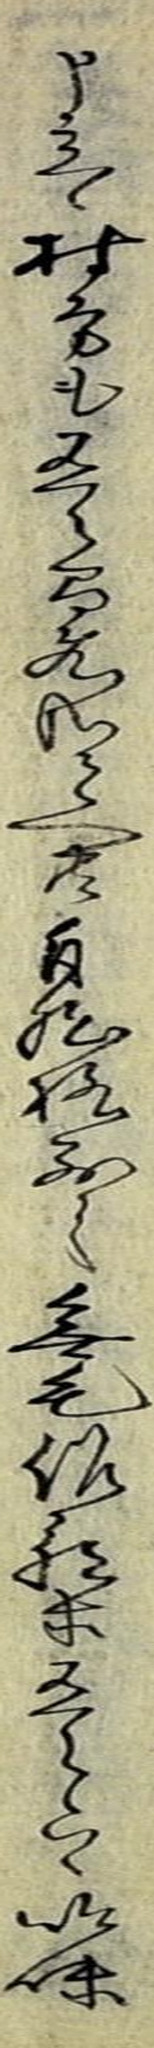申立候村方も有之間敷哉に候へ共自然格別之無毛作難等有之候はヽ吟味
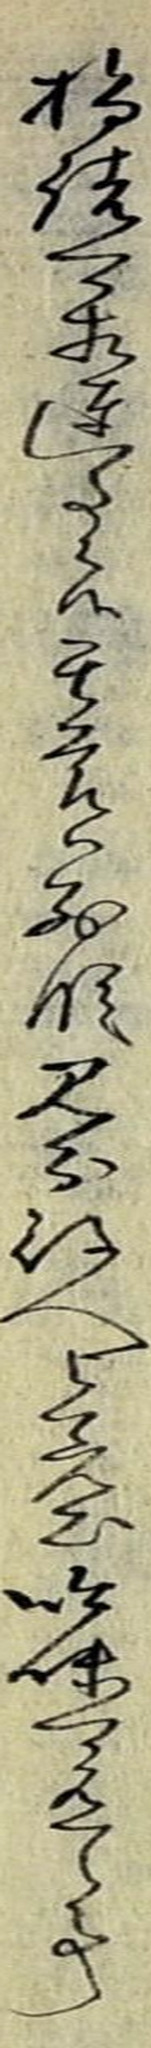指詰可相達事に候其節は別段見分役人被差出吟味可有之事
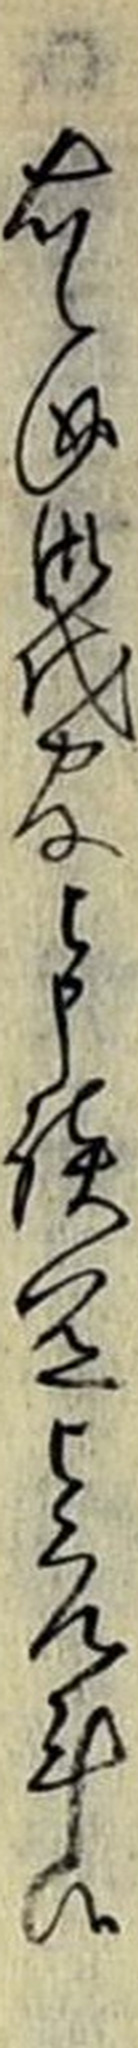右之趣御代官被申談宜被取斗候
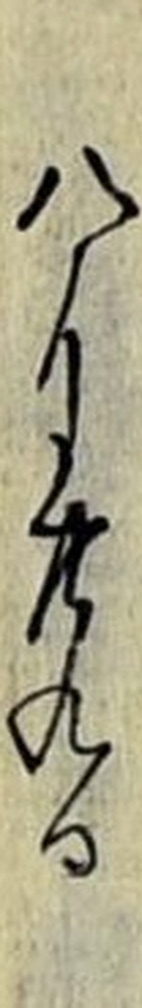八月廿九日
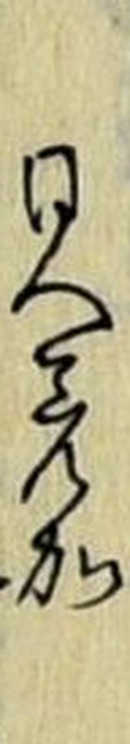同人差加
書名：命令之部 四
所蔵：福井県文書館 Fukui Prefectural Archives
